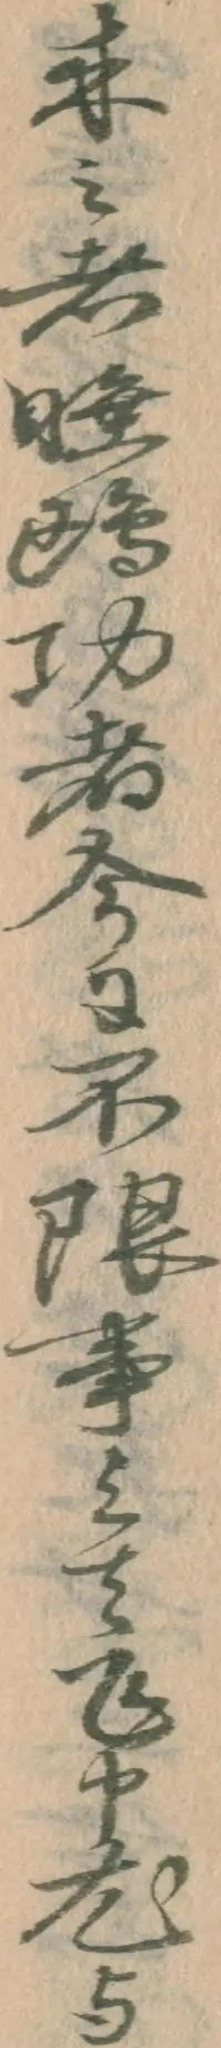来之者睡鴎功者今尓不限事与者乍申尤与
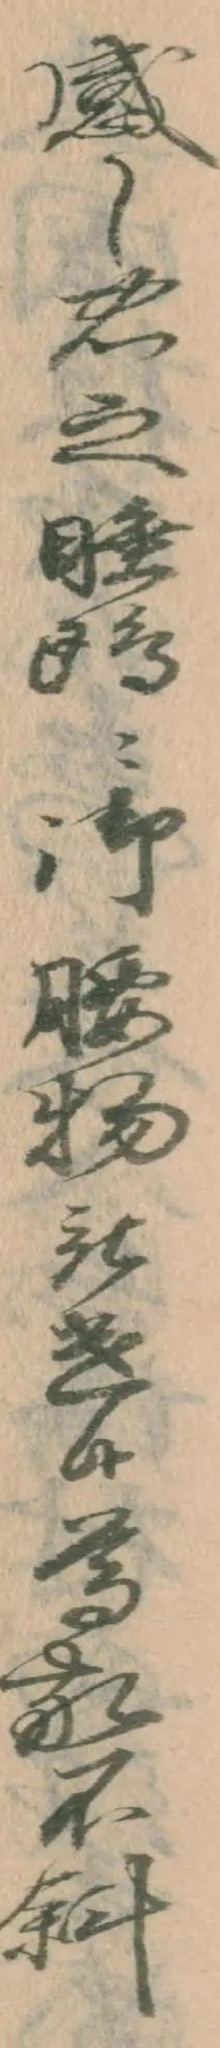感し忠之睡鴎に御腰物被遣候尊敬不斜
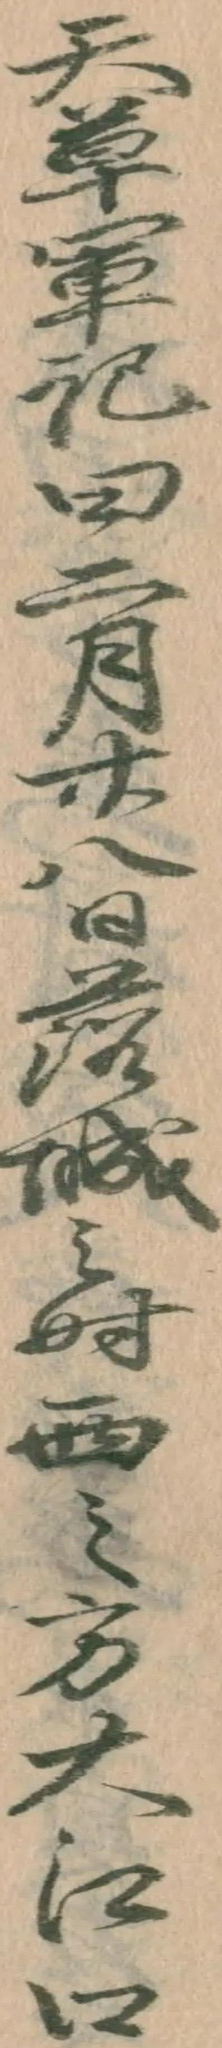天草軍記曰二月廿八日落城之時西之方大江口
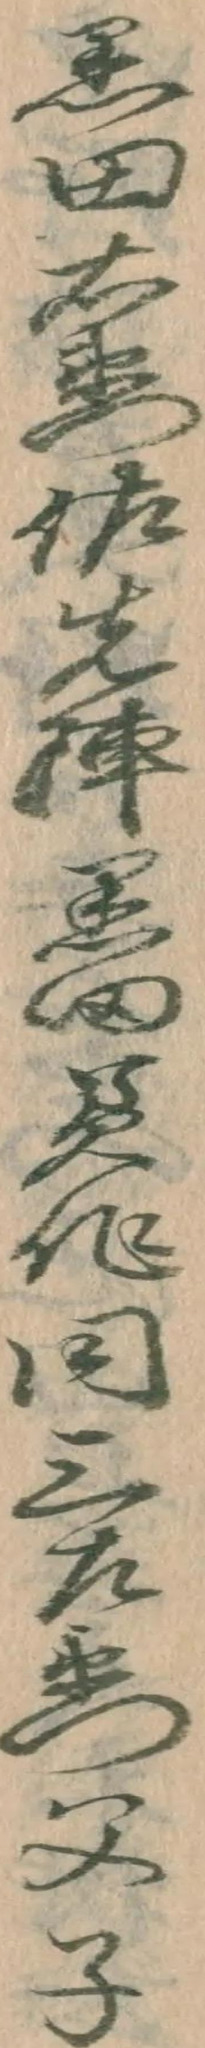黒田右衛門佐先陣黒田美作同三左衛門父子
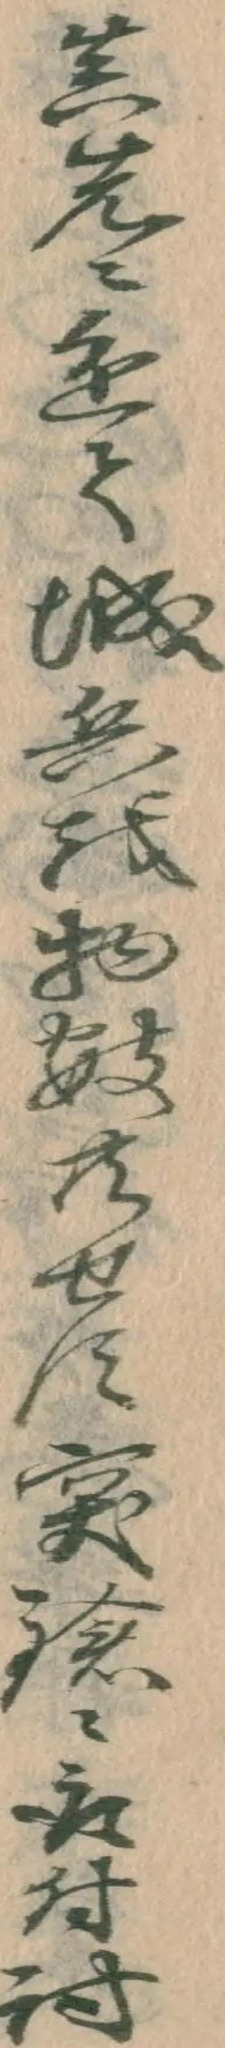真先に進て城兵越物数共せ須突鎗に取付討
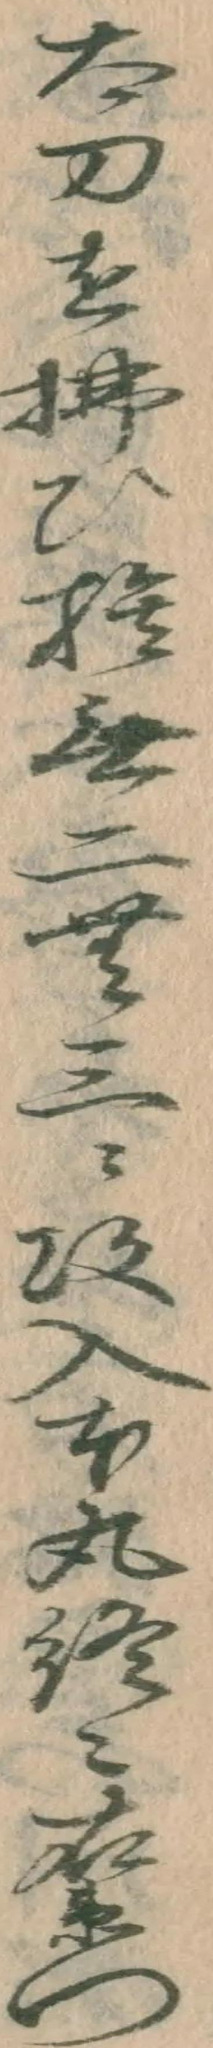太刀を払ひ捨無二無三に攻入本丸終に右衛門
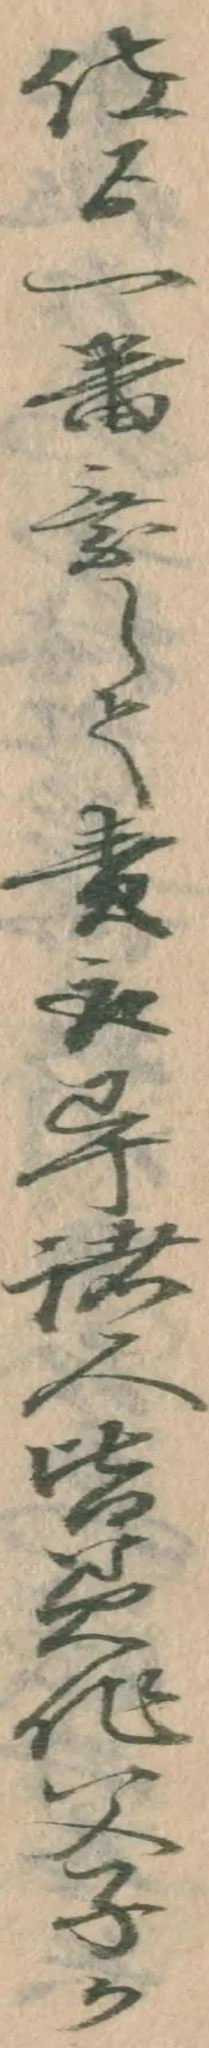佐ゟ一番乗して責取畢諸人皆美作父子か
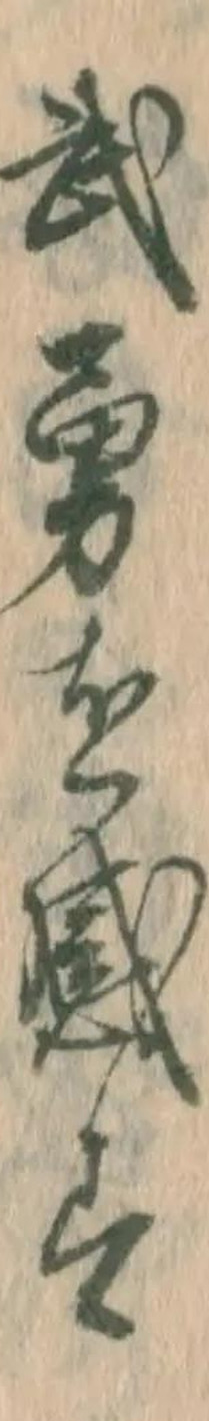武勇を感春
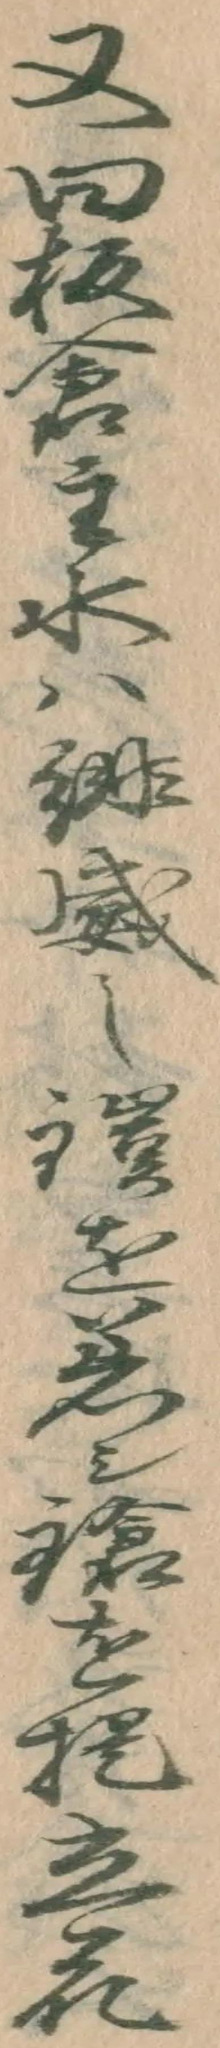又曰板倉主水は緋感し鎧を着し鎗を提立花
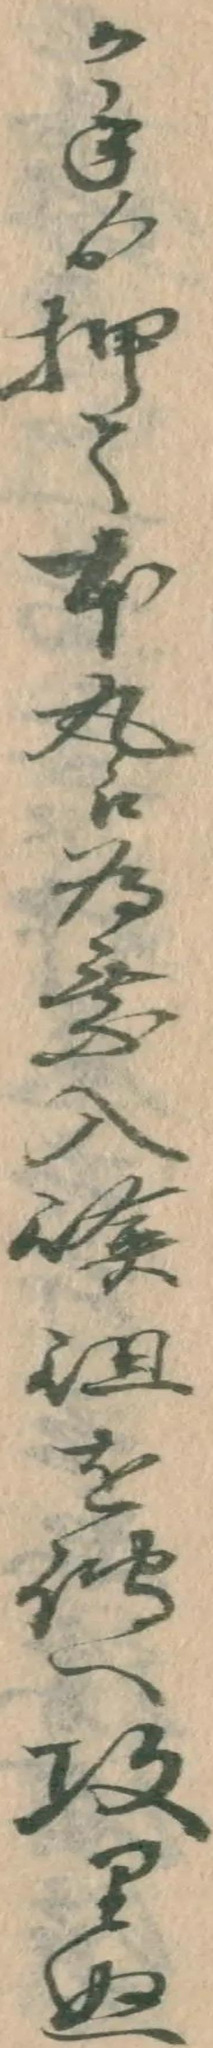か手ゟ押て本丸江為乗入嶮岨を伝へ攻里怒
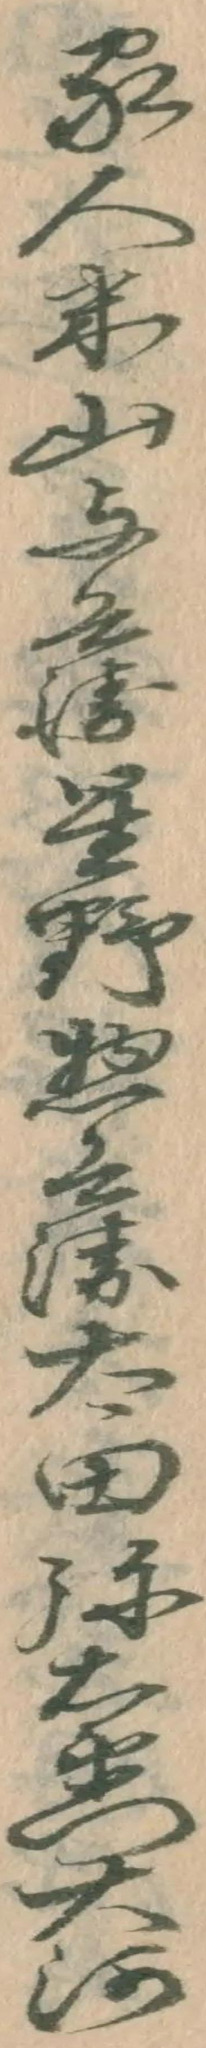家人米山与兵衛星野惣兵衛太田弥右衛門大河

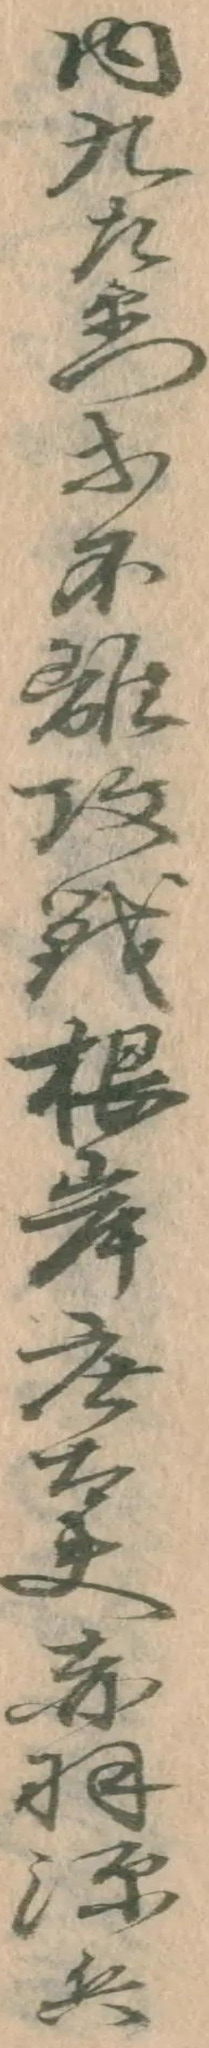内九左衛門等不難攻戦根岸庄太夫赤羽源兵
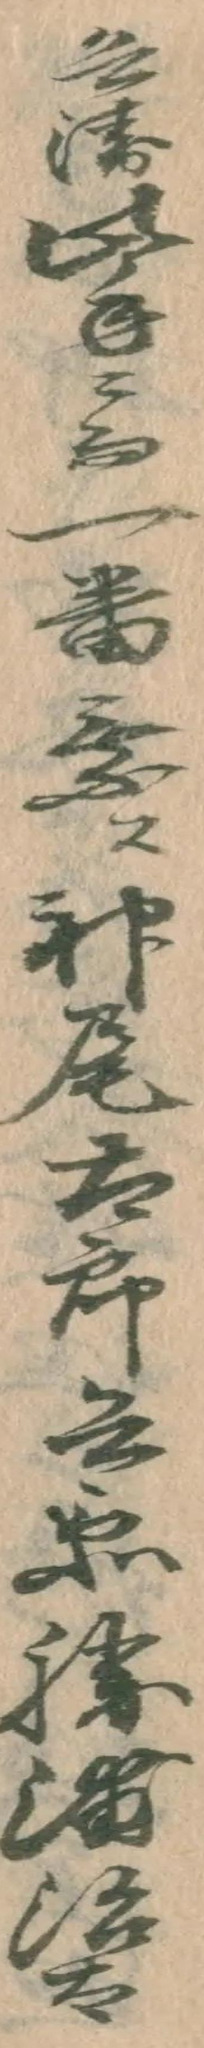兵衛此手に而一番乗す神尾太郎兵衛勝浦治太
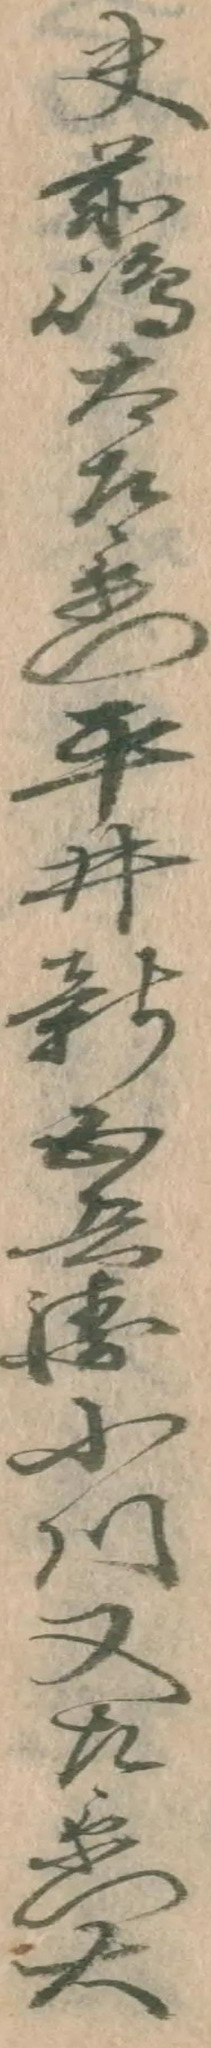夫前島太左衛門平井新五兵衛小川又左衛門大
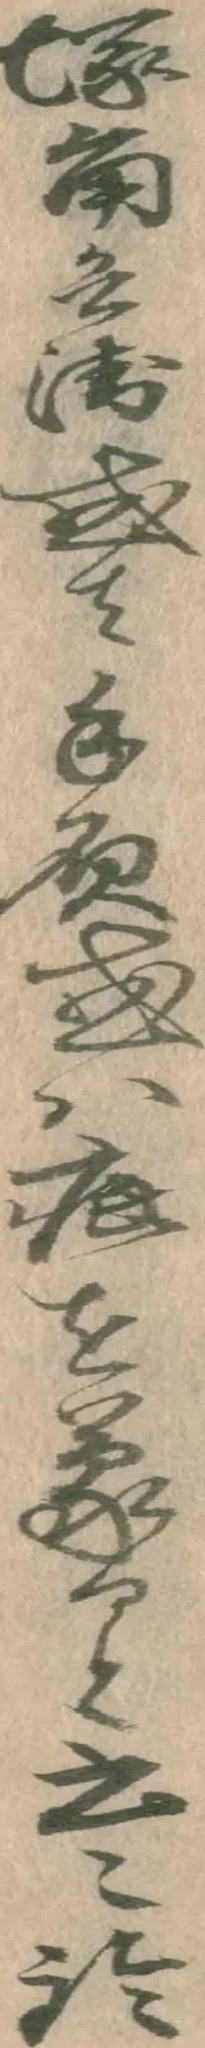塚角兵衛或者手負或は疵を蒙ると云々鈴
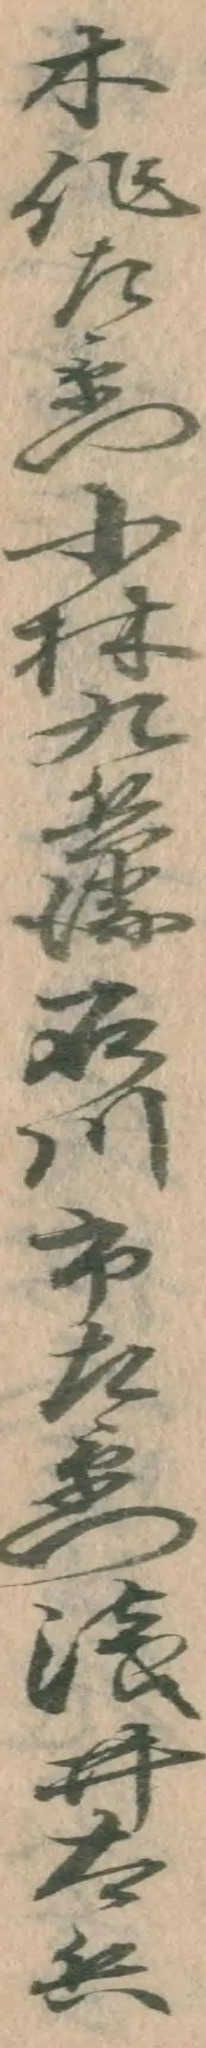木作左衛門小林九兵衛石川市左衛門浅井太兵
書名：切支丹御退治記 49巻. [8]
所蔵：国立国会図書館 National Diet Library, JAPAN
